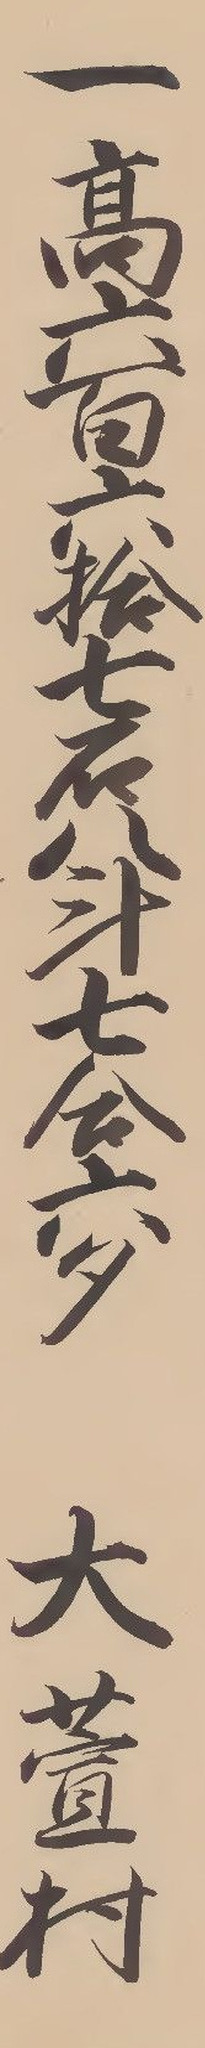一高六百六拾七石八斗七合六勺大萱村
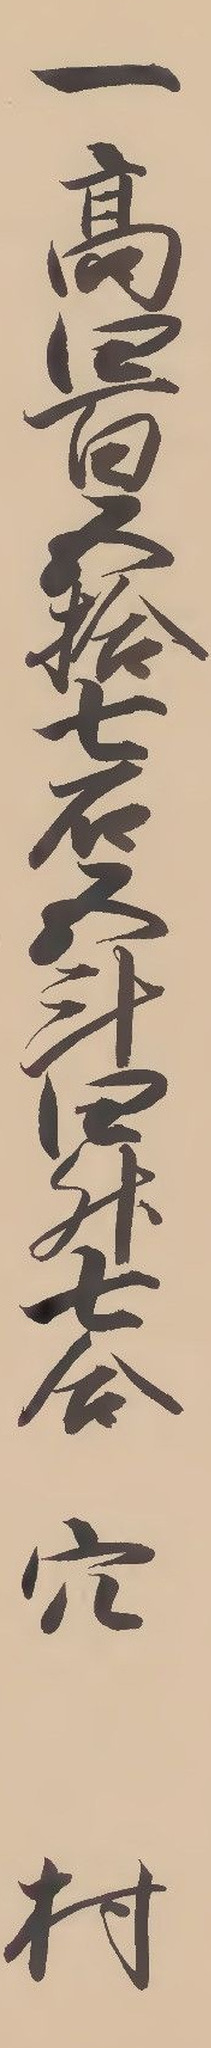一高四百五拾七石五斗四升七合穴村
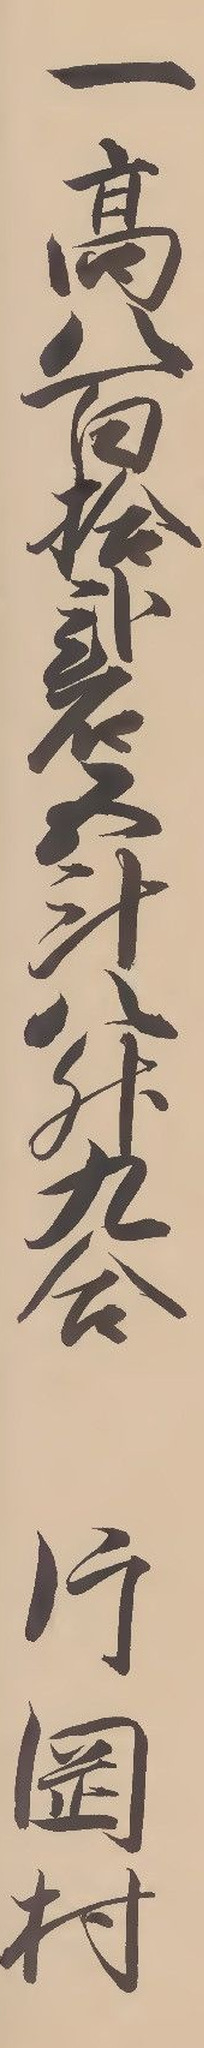一高八百拾弐石五斗八升九合片岡村
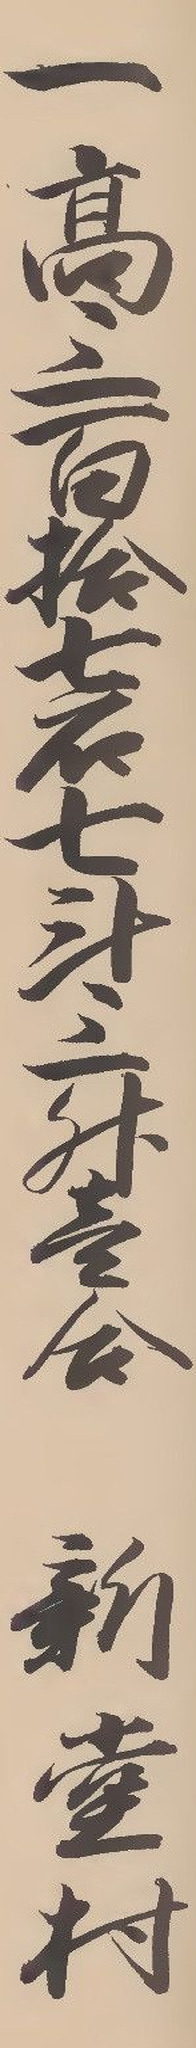一高三百拾七石七斗三升壱合新堂村
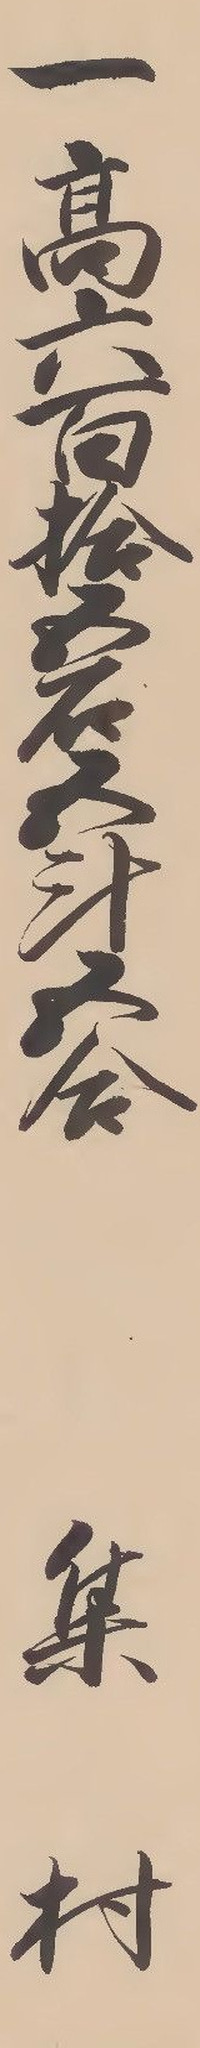一高六百拾五石五斗五合集村
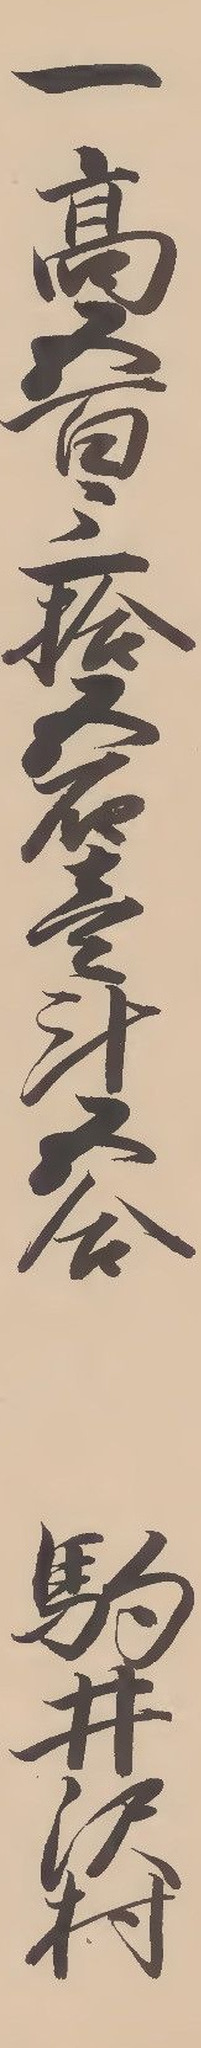一高五百三拾五石壱斗五合駒井沢村
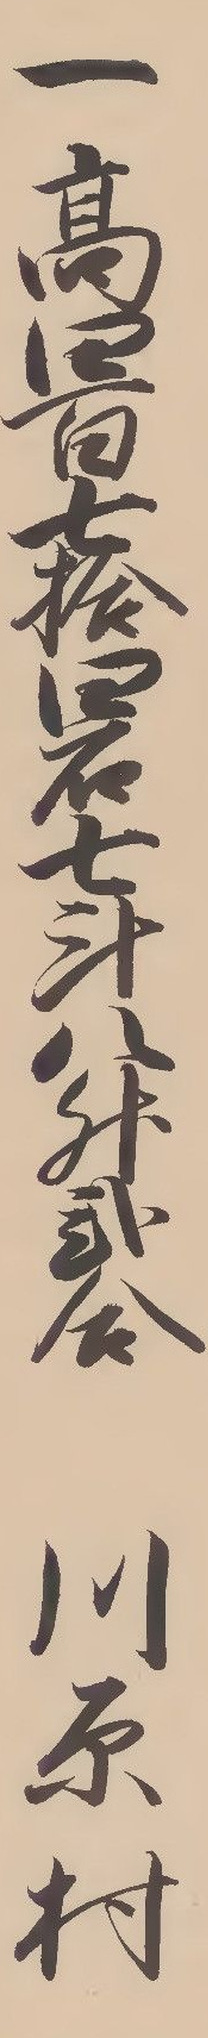一高四百七拾四石七斗八升弐合川原村

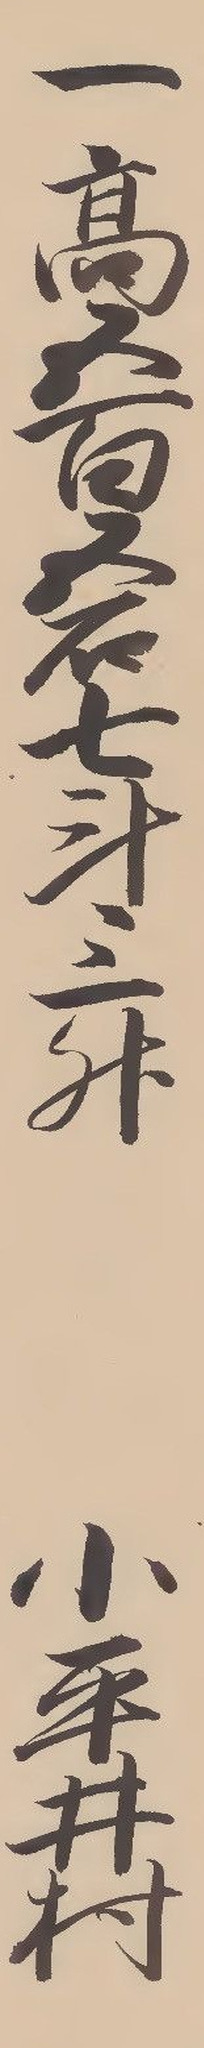一高五百五石七斗三升小平井村
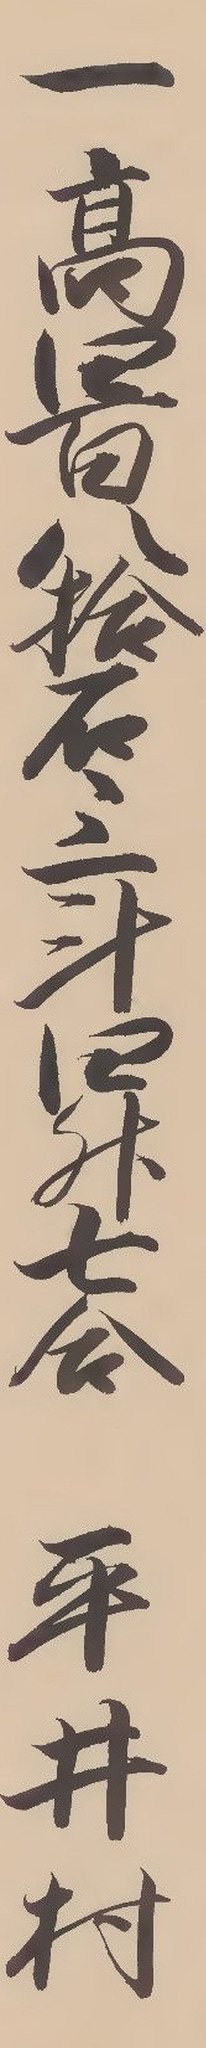一高四百八拾石三斗四升七合平井村
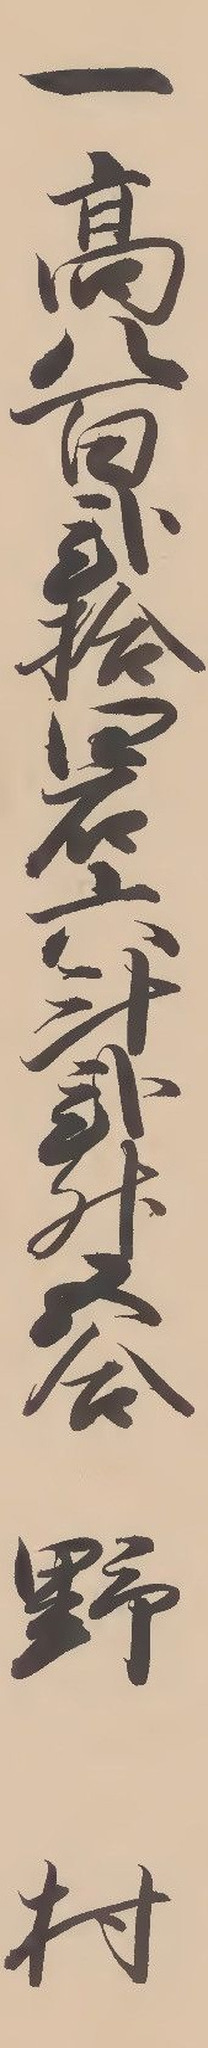一高八百弐拾四石六斗弐升五合野村
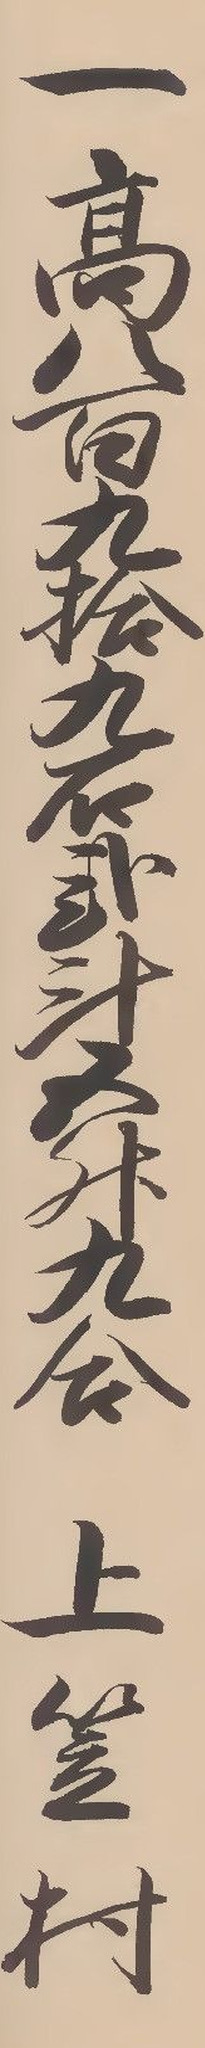一高八百九拾九石弐斗五升九合上笠村
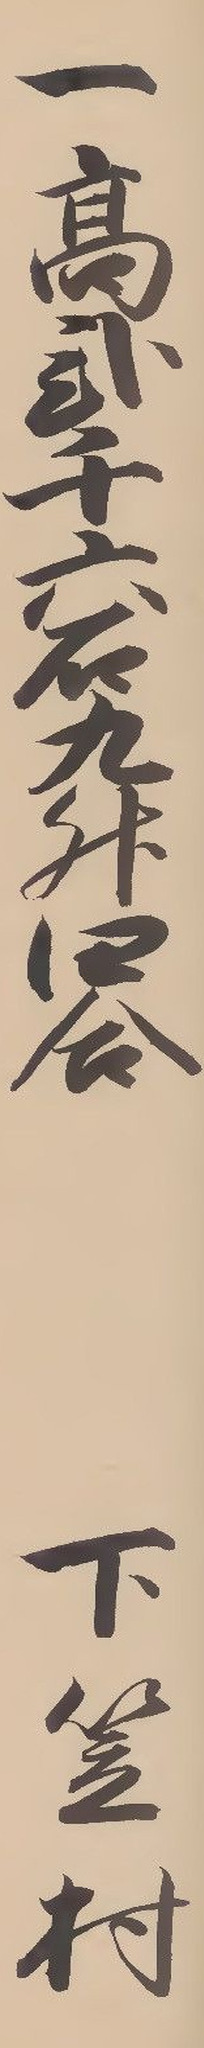一高弐千六右九升四合下笠村
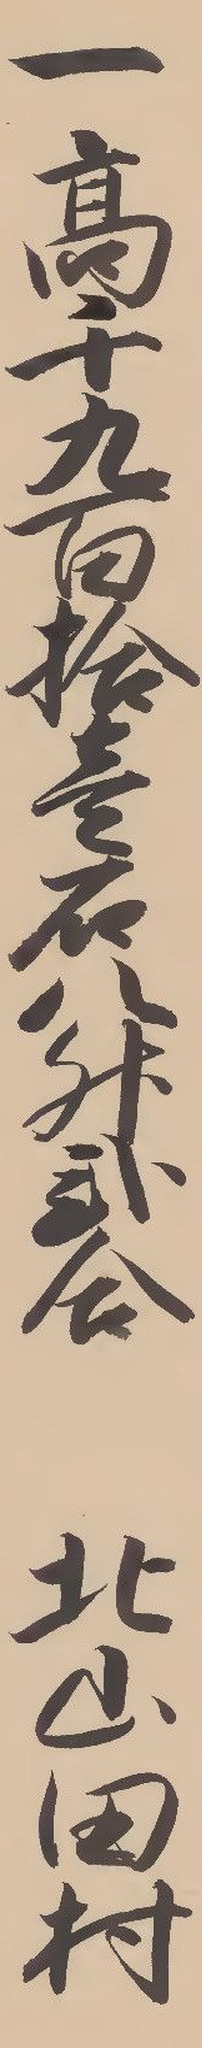一高千九百拾壱石八升弐合北山田村
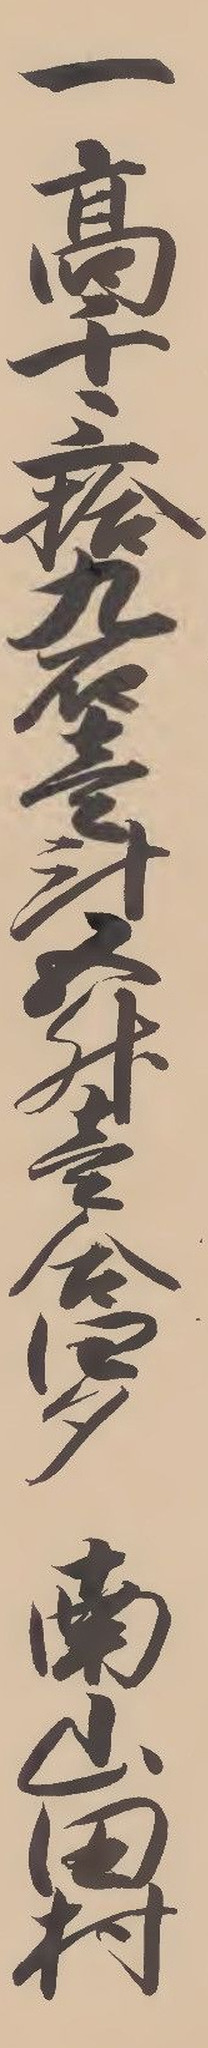一高千三拾九石壱斗五升壱合四勺南山田村
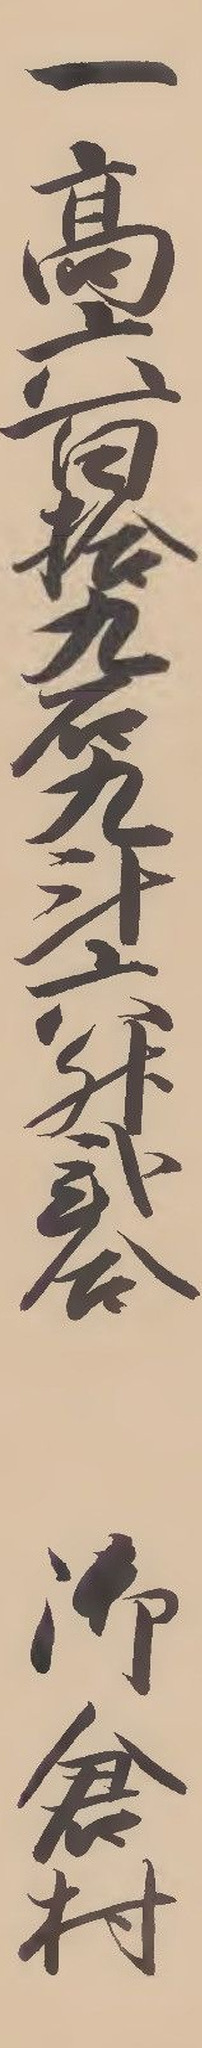一高六百拾九石九斗六升弐合御倉村

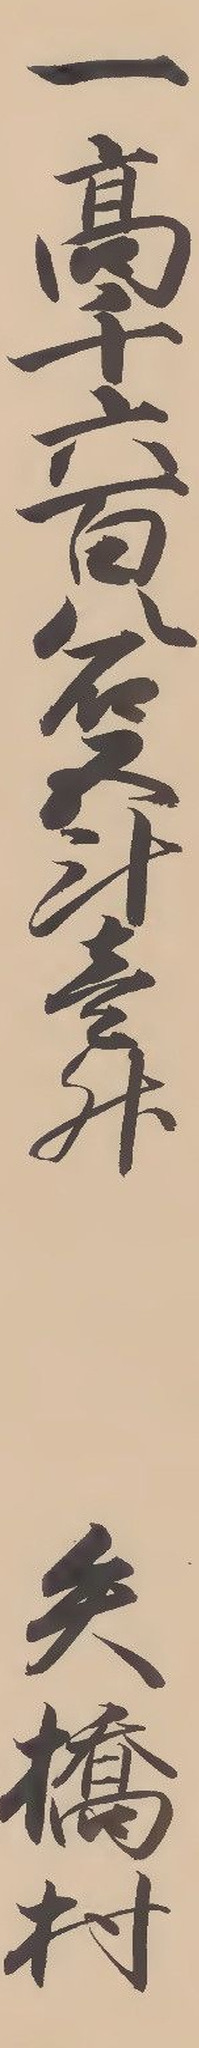一高千六百八石五斗壱升矢橋村
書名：近江国郷帳
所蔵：国立公文書館 National Archives of Japan
